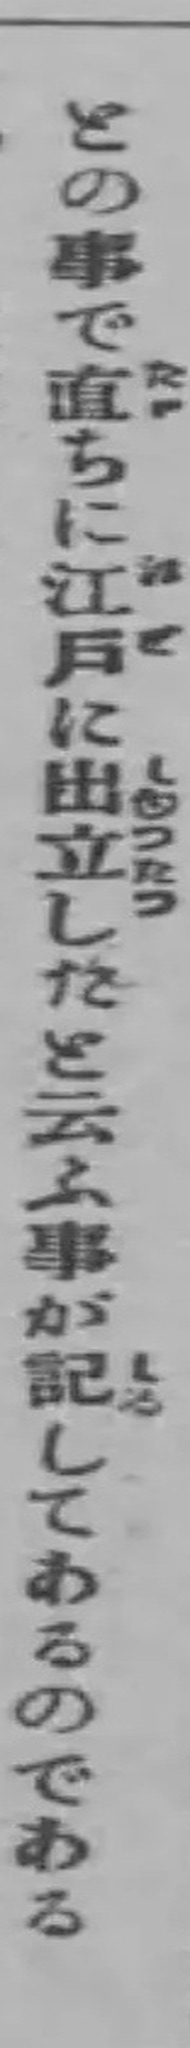との事で直ちに江戸に出立したと云ふ事が記してあるのである
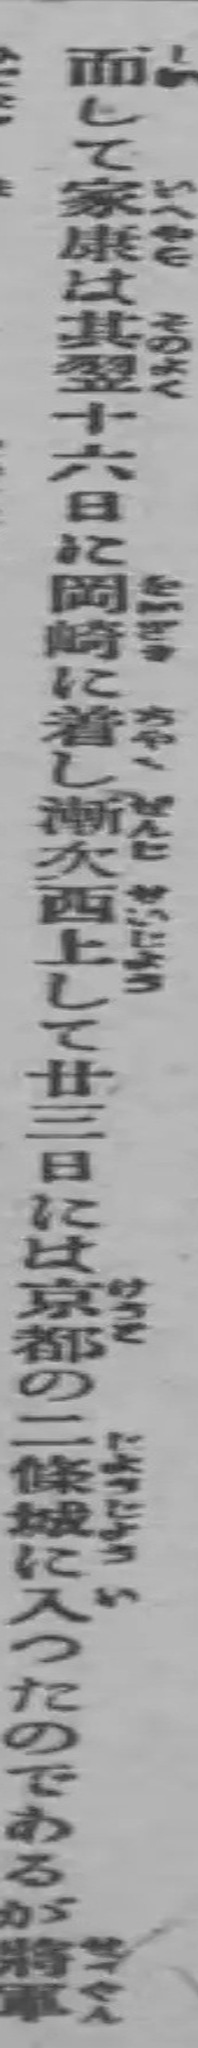而して家康は其翌十六日に岡崎に着し漸次西上して廿三日には京都の二条城に入つたのであるが将軍
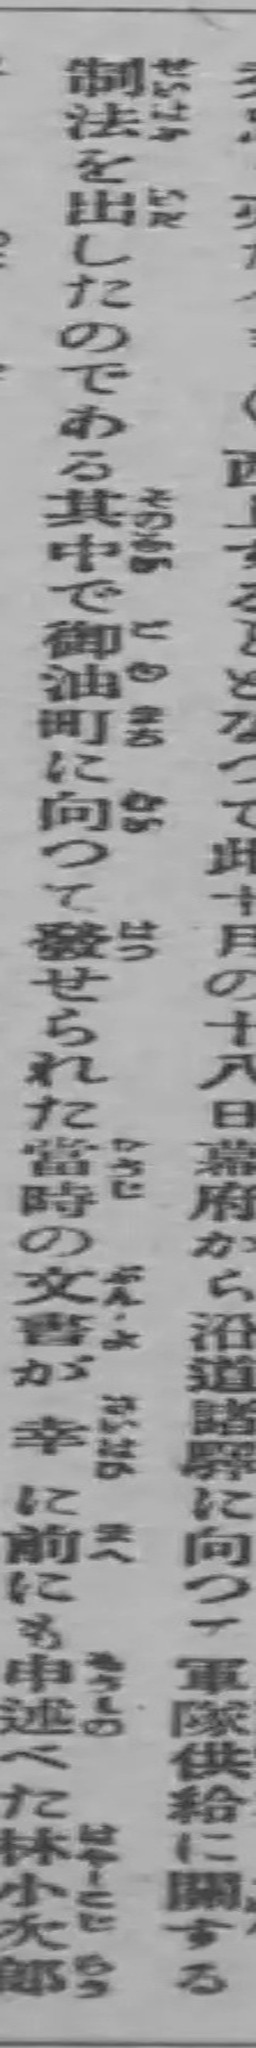制法を出したのである其中で御油町に向つて発せられた当時の文書が幸に前にも申述べた林小次郎
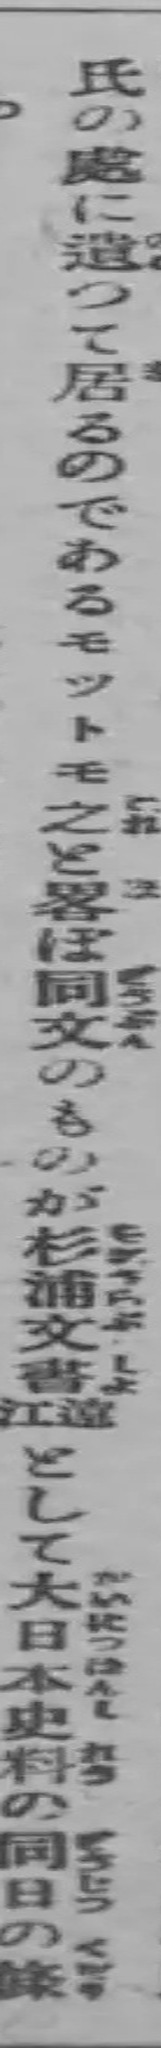氏の処に遺つて居るのであるモツトモ之と略ぼ同文のものが杉浦文書遠江として大日本史料の同日の条
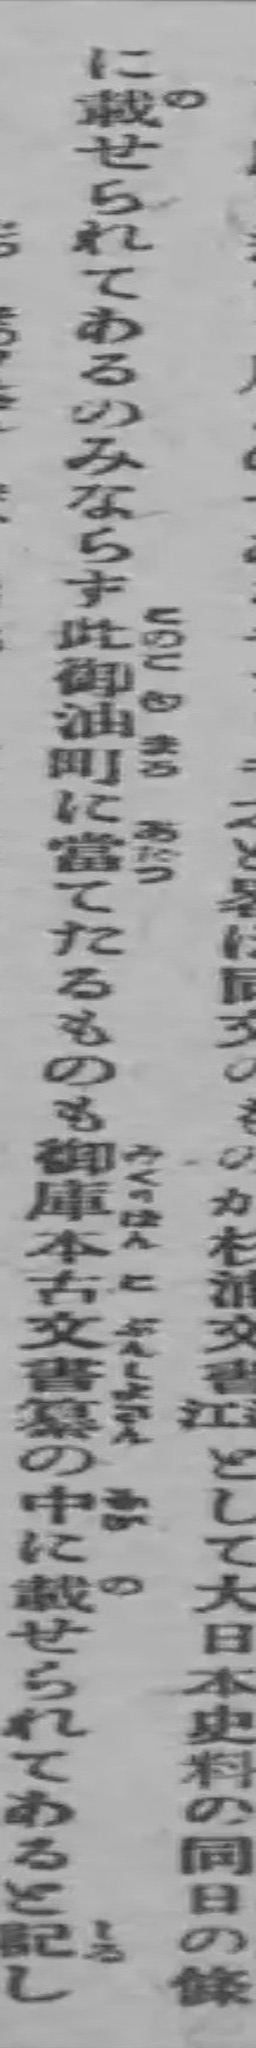に載せられてあるのみならず此御油町に当てたるものも御庫本古文書纂の中に載せられてあると記し
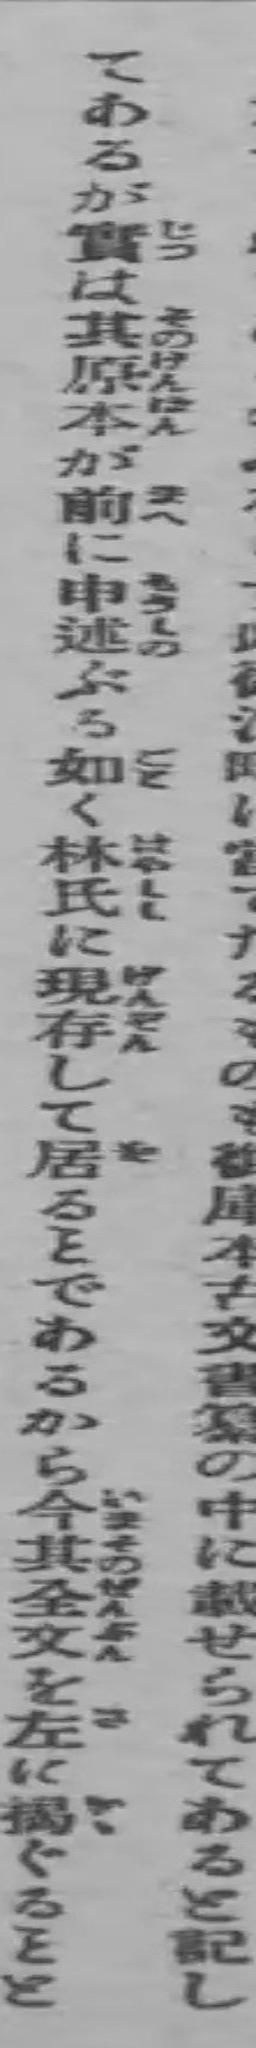てあるが実は其原本が前に申述ぶる如く林氏に現存して居ることであるから今其全文を左に掲ぐることと
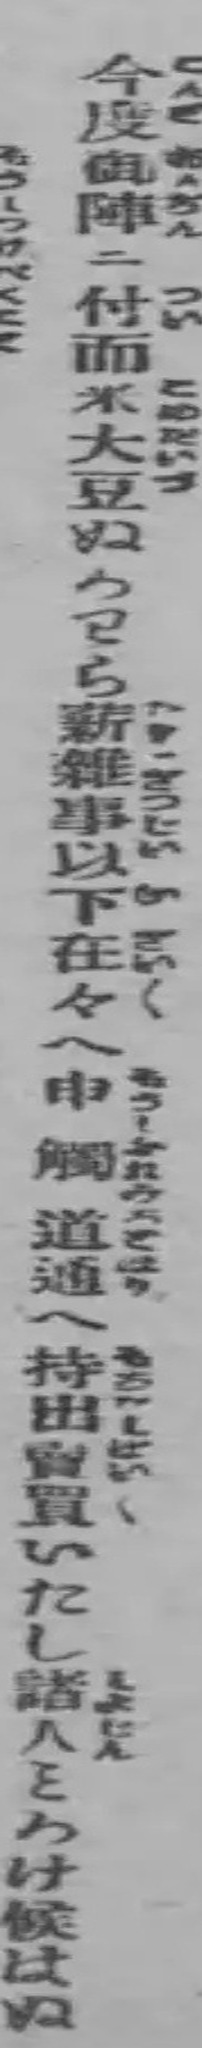林文書今度御陣ニ付而米大豆ぬかわら薪雑事以下在々へ申触道通へ持出売買いたし諸人ことかけ候はぬ
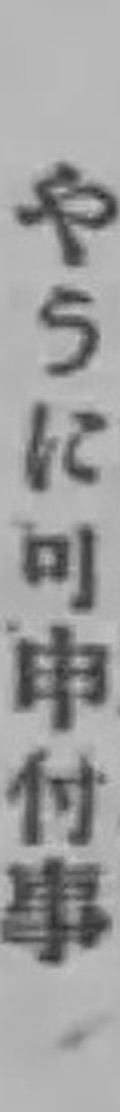やうに可申付事
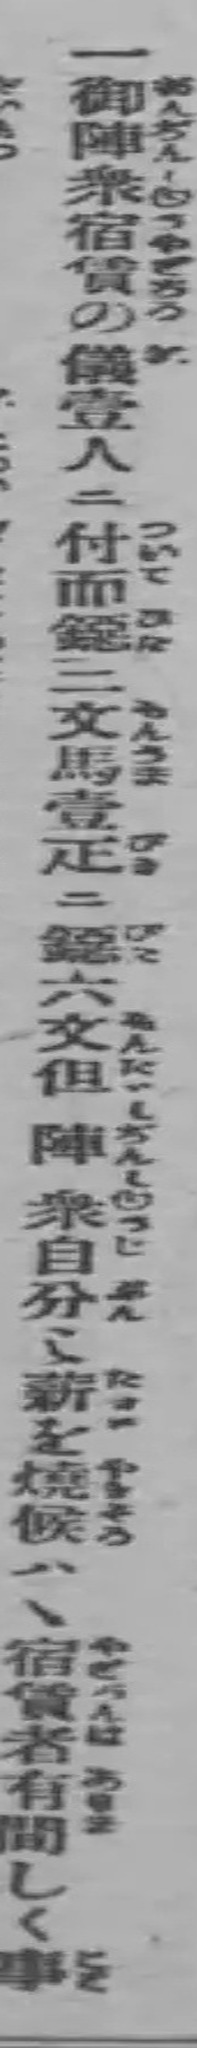一御陣衆宿賃の儀壱人ニ付而鐚二文馬壱疋ニ鐚六文但陣衆自分の薪を焼候ハヽ宿賃者有間しく事
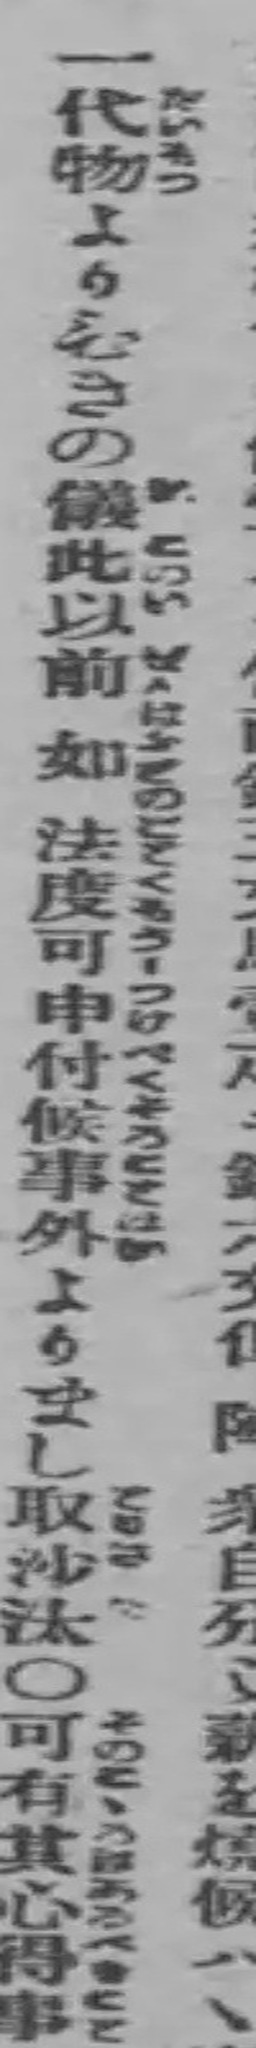一代物よりひきの儀此以前如法度可申付候事外よりまし取沙汰〇可有其心得事
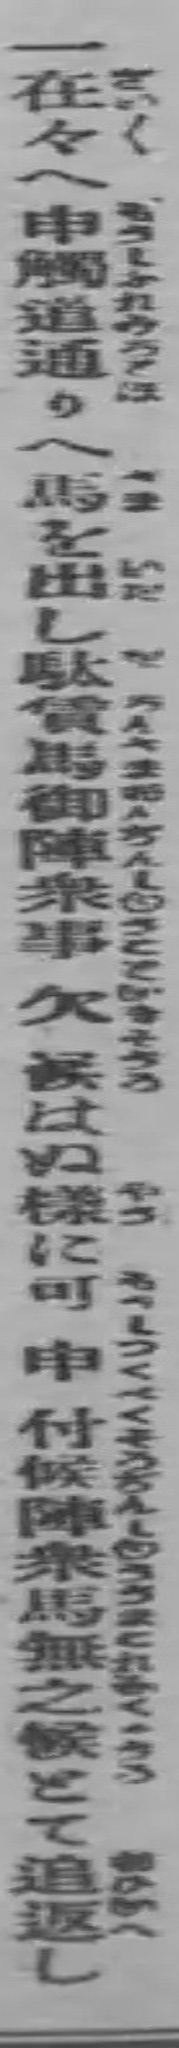一在々へ申触道通りへ馬を出し駄賃馬御陣衆事欠候はぬ様に可申付候陣衆馬無之候とて追返し
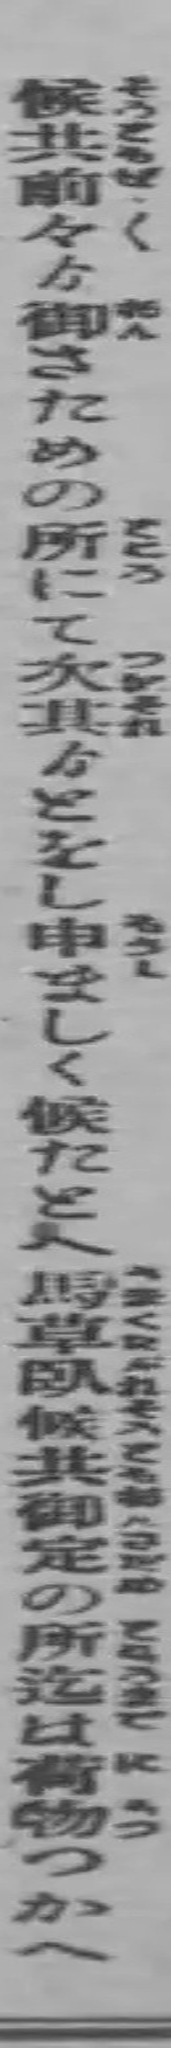候共前々ゟ御さための所にて次其ゟとをし申ましく候たとへ馬草臥候共御定の所迄は荷物つかへ
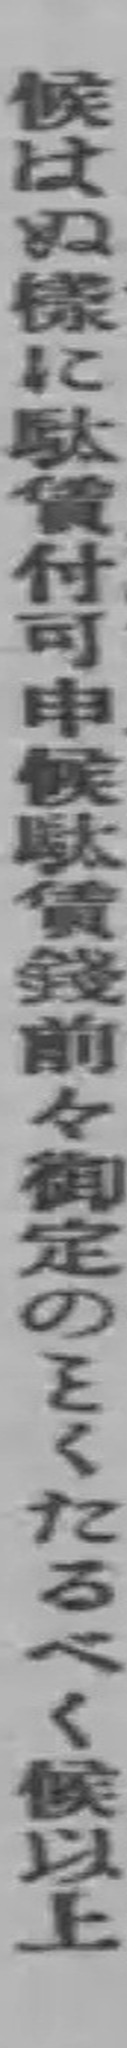候はぬ様に駄賃付可申候駄賃銭前々御定のことくたるべく候以上
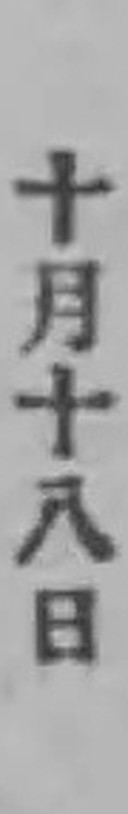十月十八日
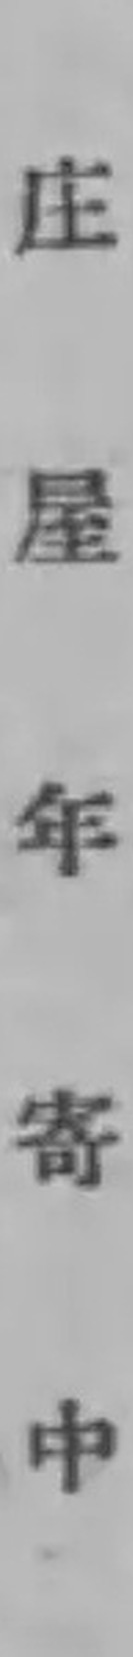庄屋年寄中
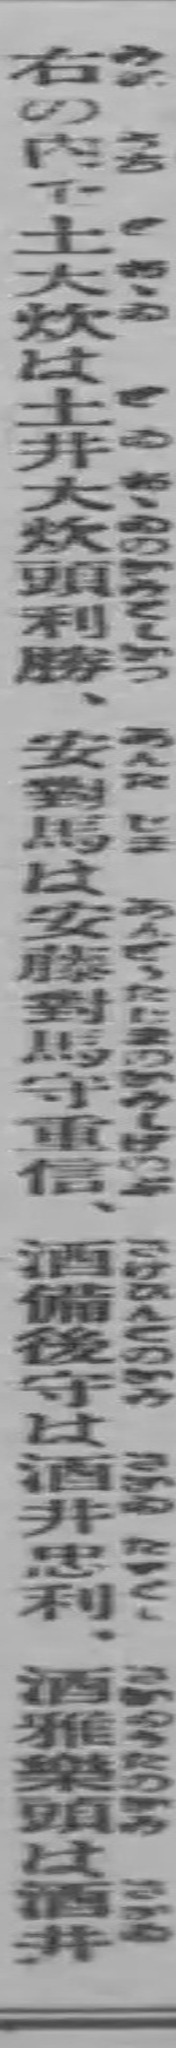右の内で土大炊は土井大炊頭利勝、安対馬は安藤対馬守重信、酒備後守は酒井忠利、酒雅樂頭は酒井
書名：豊橋市史談
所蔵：国立国会図書館 National Diet Library, JAPAN
